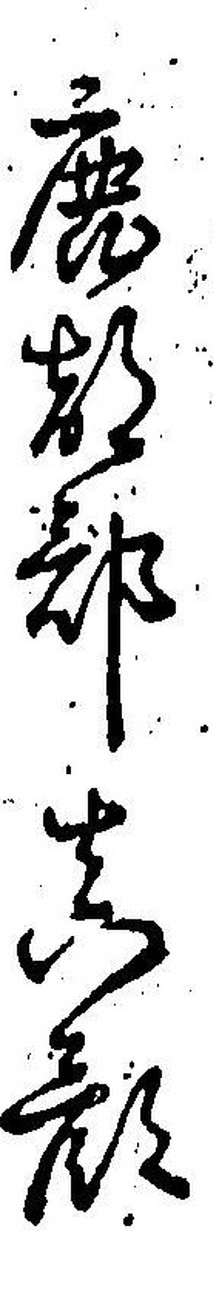鹿都部真顔
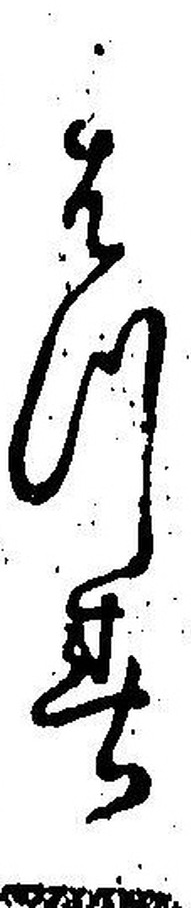はつ春

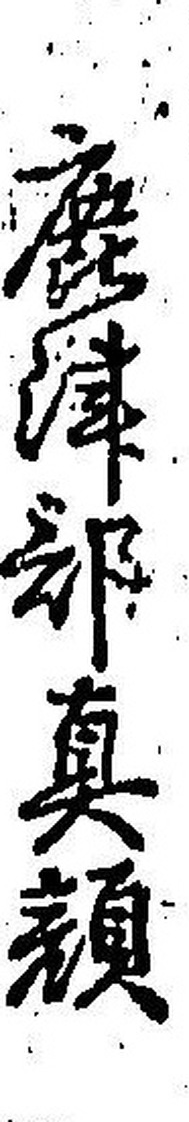鹿津部真顔
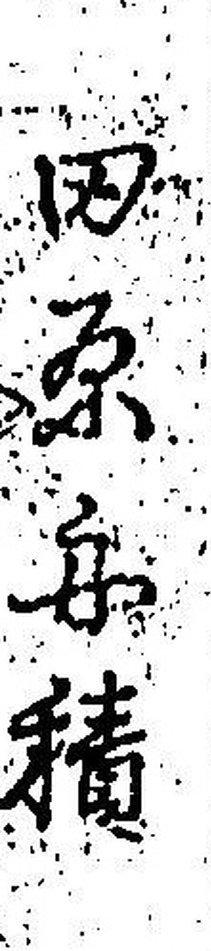田原舟積
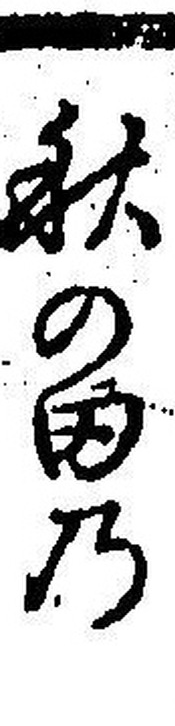秋の田の
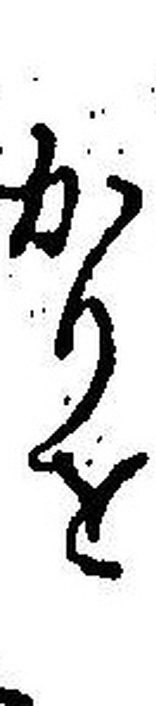かりを
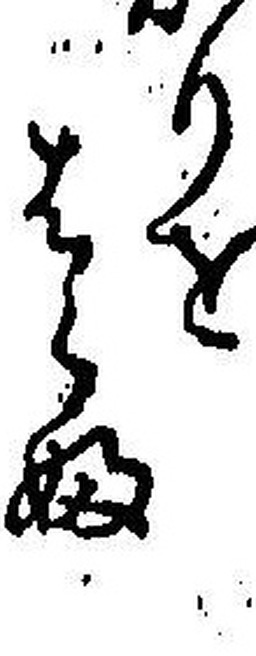はらふ
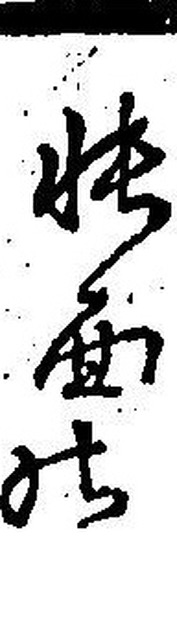帳面の
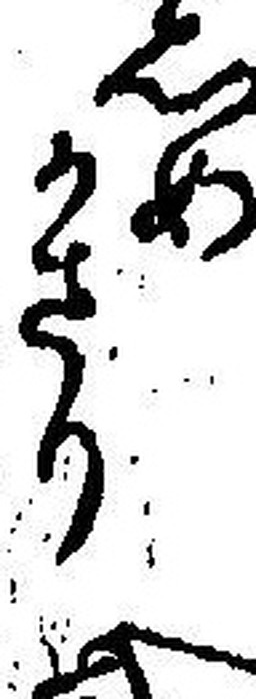かさり
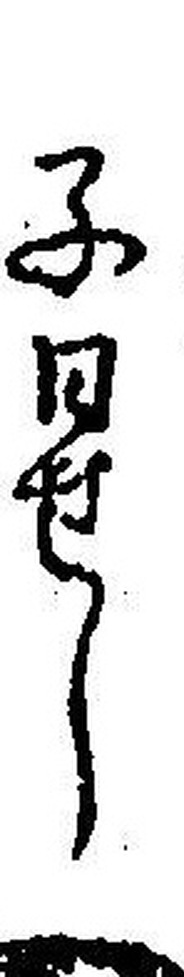子日せし
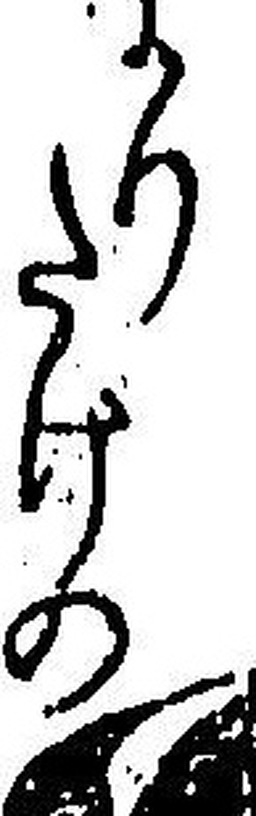たけの
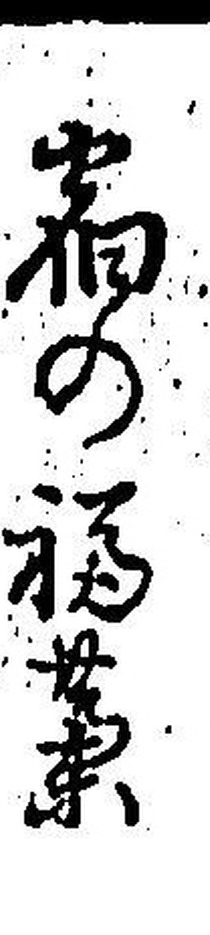宿の福藁
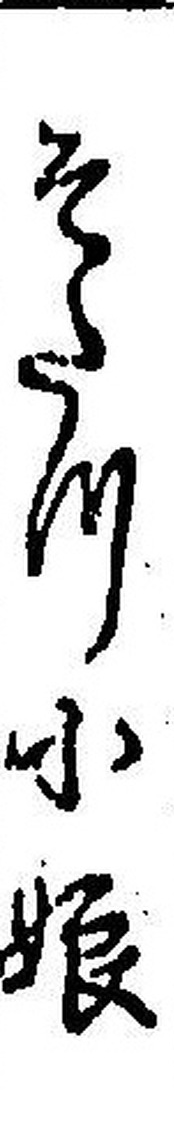そたつ小娘
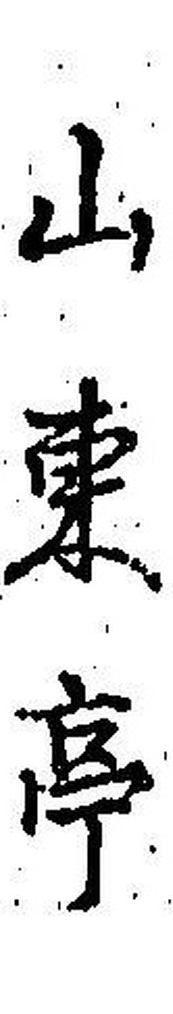山東亭
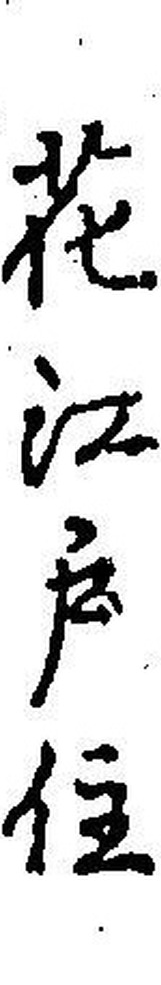花江戸住
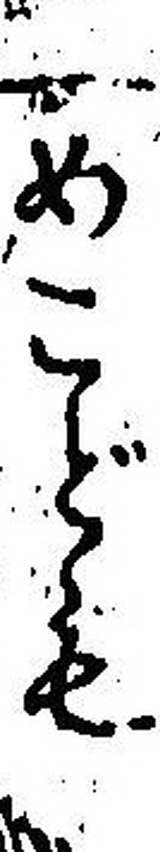めこども
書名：どうれ百人一首 / 鹿都部真顔(狂歌堂)編
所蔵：東京大学総合図書館 General Library in the University of Tokyo, JAPAN
